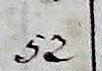52
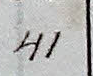41
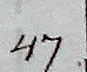47
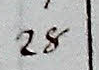28
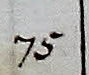75
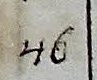46
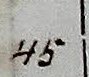45
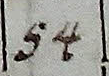54
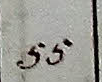55
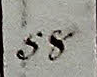58
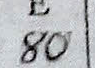80
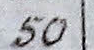50
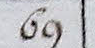69
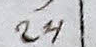24
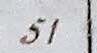51
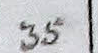35
